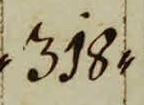318
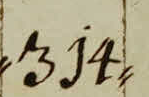314
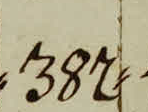382
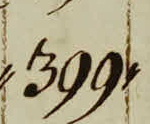399
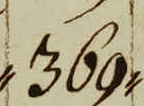369
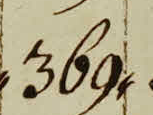369
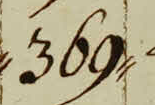369
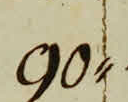90
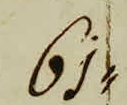61
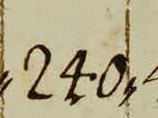240
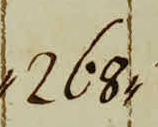268
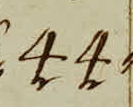44
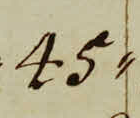45
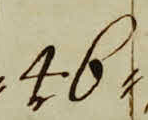46
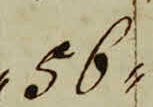56
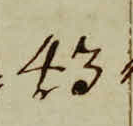43
